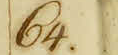64.
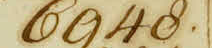6948.
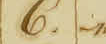6.
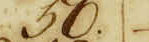56.
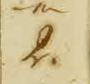2.
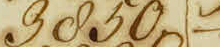3850.
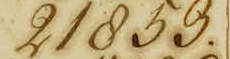21853.
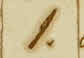1.
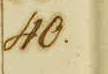40.
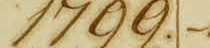1799.
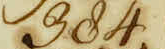384
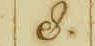8.
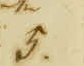5.
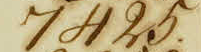7425.
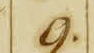9.
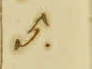5.
